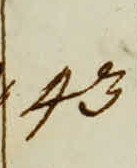43
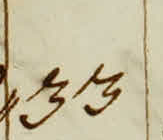33
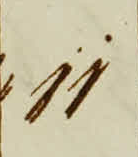11
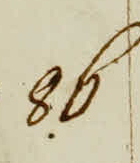86
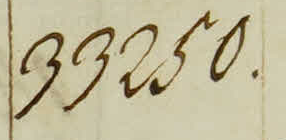33250
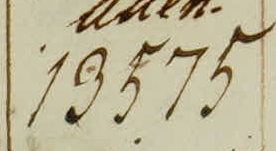13575
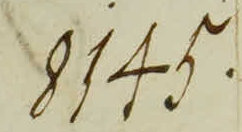8145
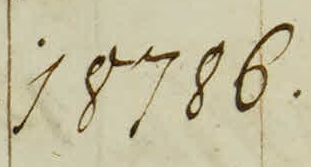18786
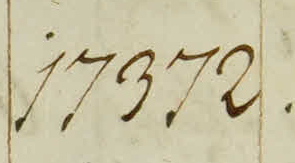17372
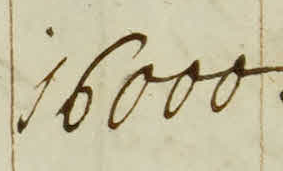16000
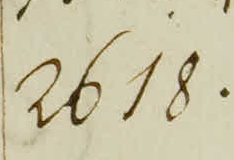2618
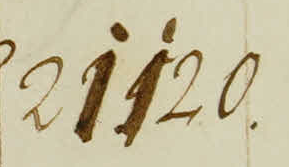21120
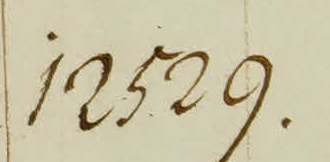12529.
